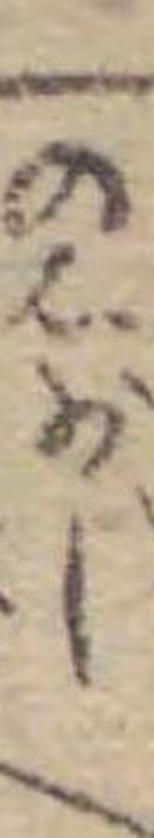の心少し
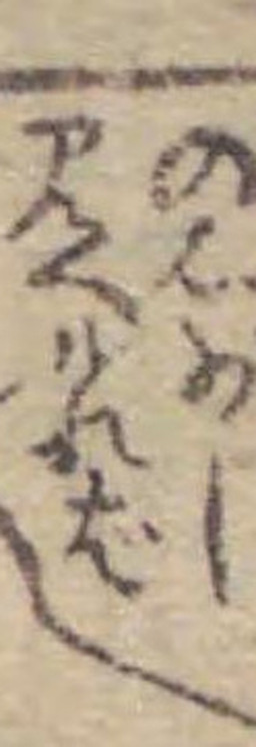みへければ
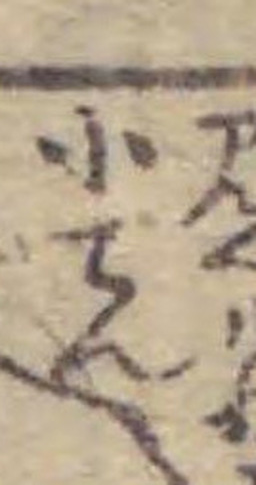小てん
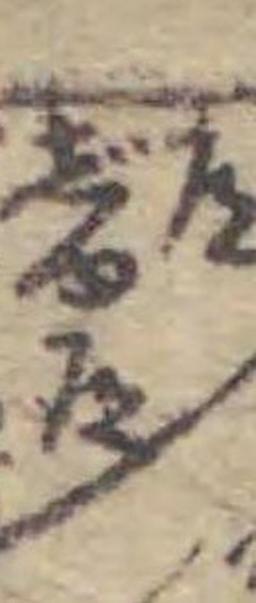じゆ道
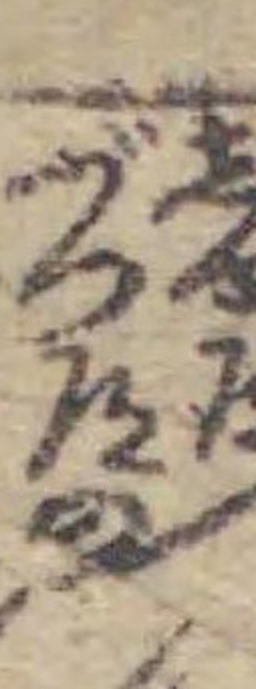ぶつ道の
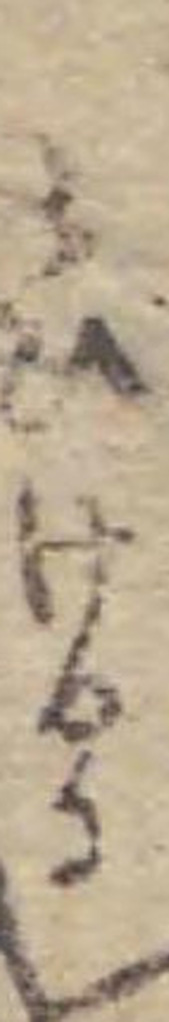とひけるに
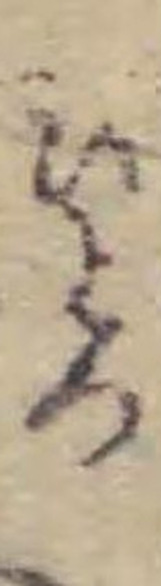ひとつ
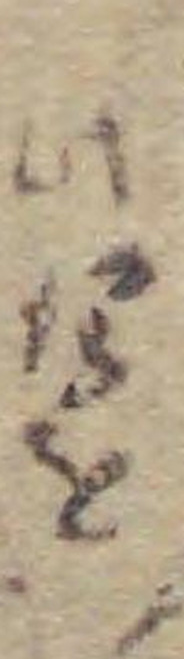此理を
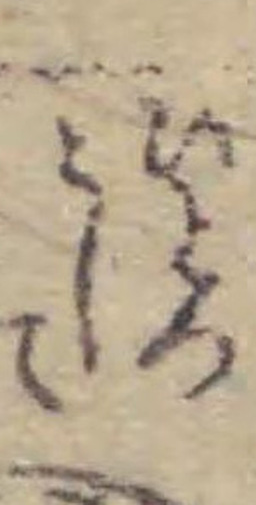として
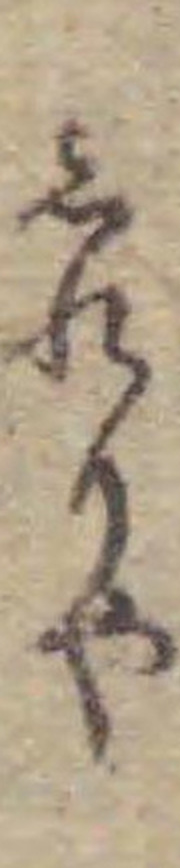しれりや
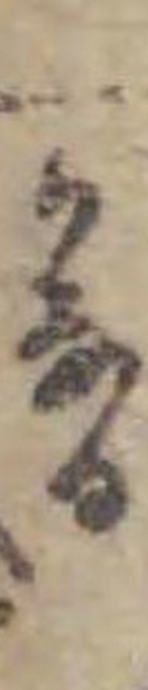かなる
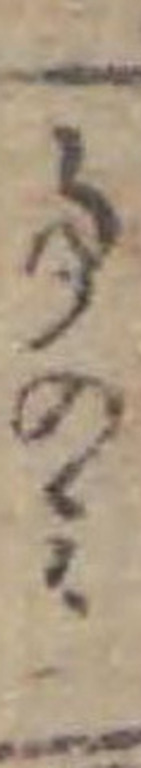事のみ
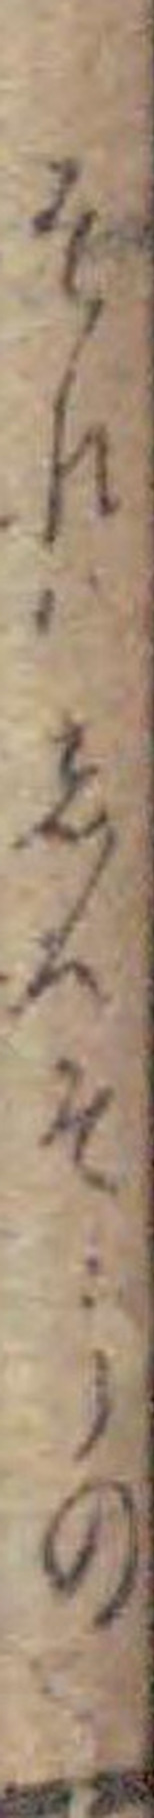それはしんそうの
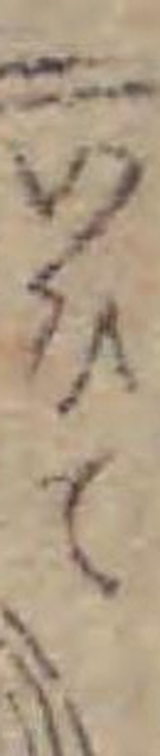いひて
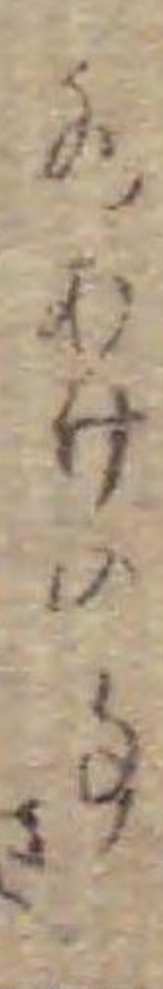水あげの事
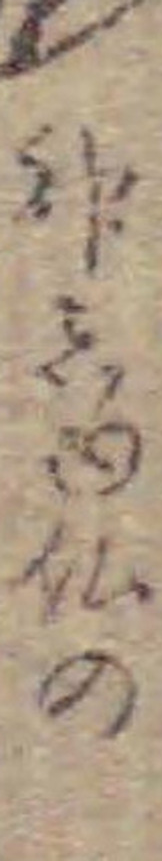神しゆ仏の
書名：鼻峰高慢男 : 2巻
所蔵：国立国会図書館 National Diet Library, JAPAN
